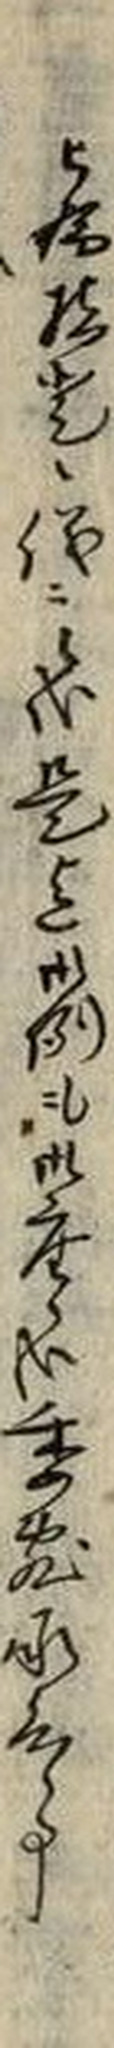被為指登候儀ニ候哉是迄御例も御座候哉委敷承度候事
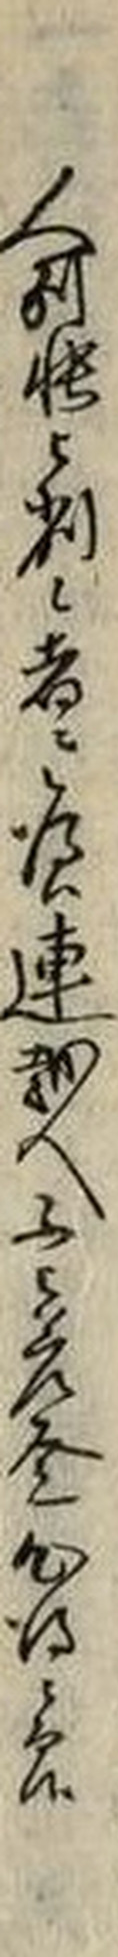人別帳被削候者ニ候得ハ連越人不被差登心得ニ而候
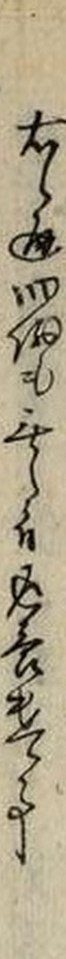右之通以儀も無之候ニ付返答遣候事
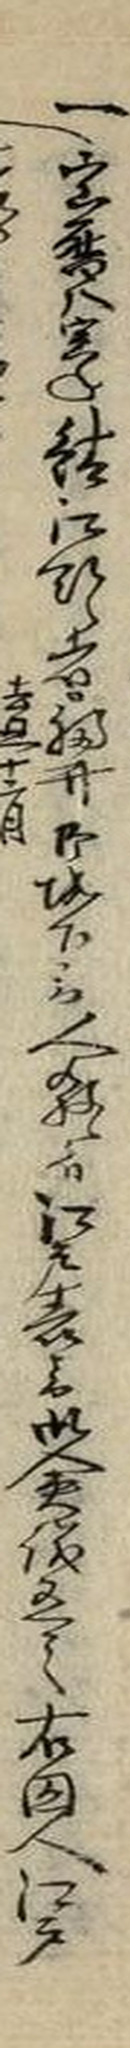一宝暦八寅年鯖江領之者〇去丑十二月福井御城下ニ而人殺候ニ付江戸表ニ而御僉議有之右囚人江戸
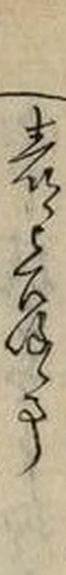表へ被召呼候事
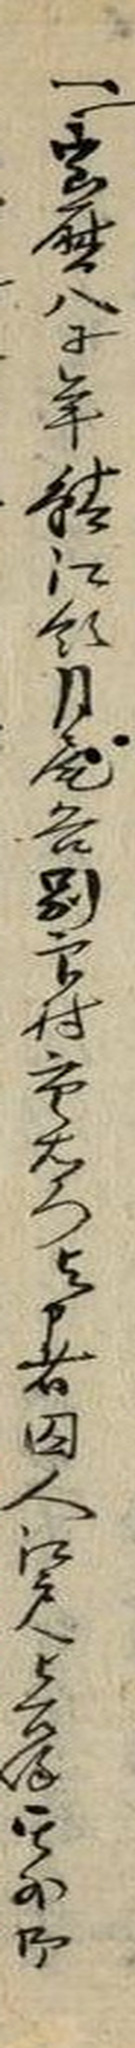一宝暦八寅年鯖江領月尾谷別印村市郎右衛門与申者囚人江戸へ被召呼其外御
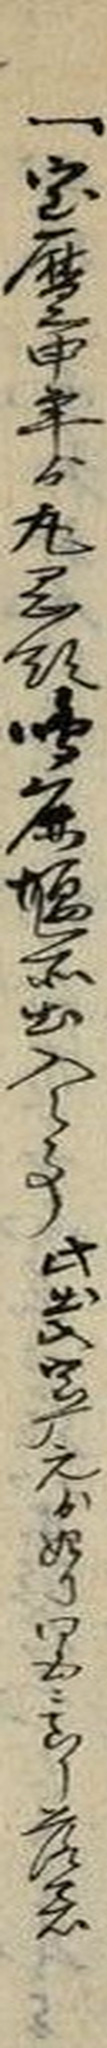一宝暦二申年ゟ丸岡領鳴鹿堰所出入之事此出入宝暦元ゟ始り同五ニ至り落着
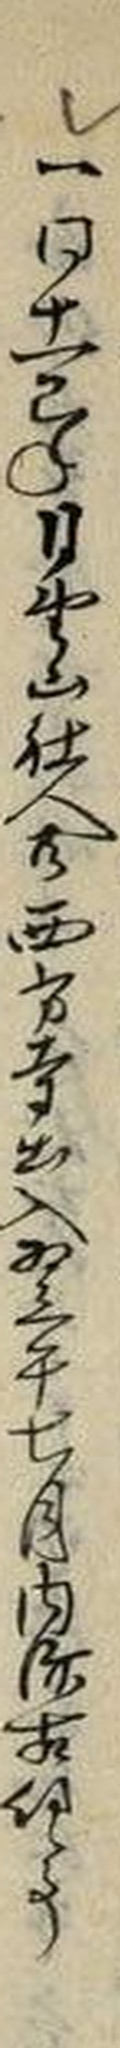レ一同十一巳年日野山社人共西方寺出入翌午七月内済相調候事
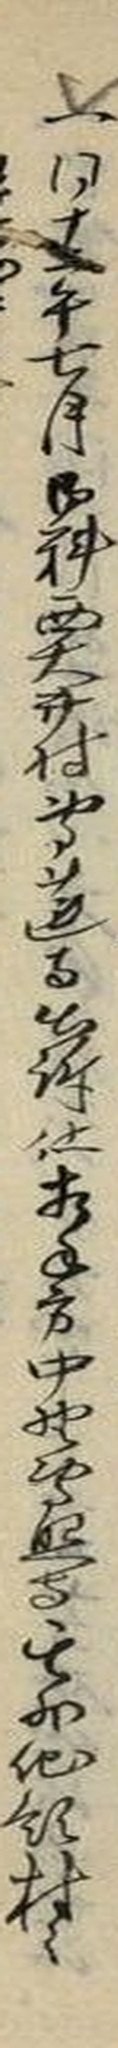レ一同十二午七月御料西大井村専蓮寺出訴仕相手方中野専照寺其外他領村々
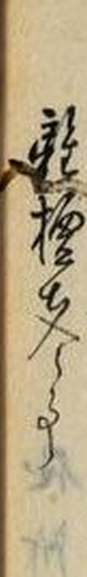離檀出入候事
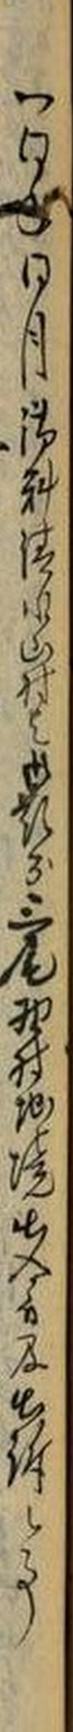一同年同月御料清水山村与御領分三尾野村地境出入ニ付及出訴候事
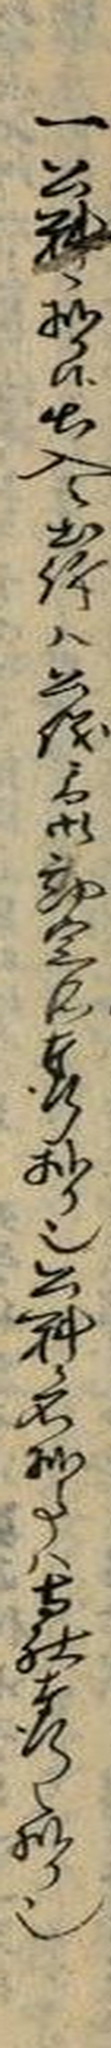一公領へ掛り候出入之出訴ハ公儀ニ而御勘定所奉行掛り也公領ニ不掛事ハ寺社奉行之掛り也
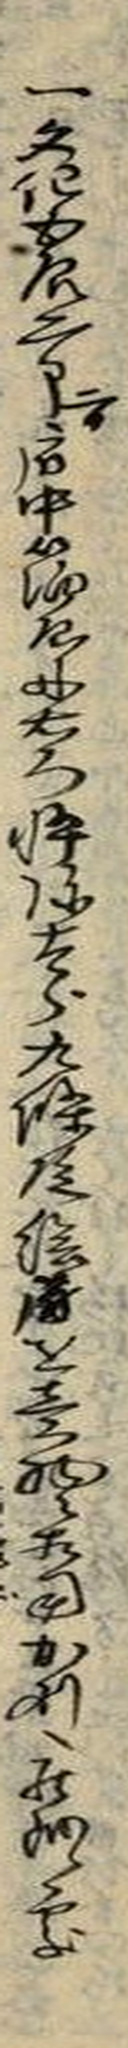一文化五辰二月二日府中箔屋丹右衛門忰弥太郎九條殿絵符を売物ニ相用加州へ罷越候処
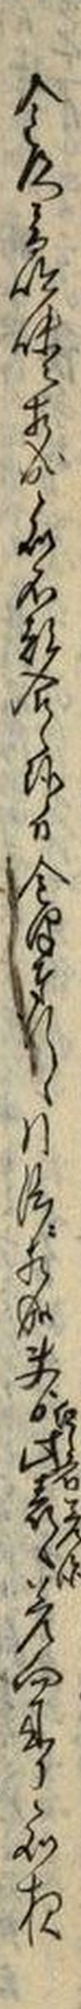金沢ニ而吟味ニ相成候処不都合之趣ニ付金津奉行へ引渡ニ相成夫ゟ組之者差添此表へ差向来り候処夜
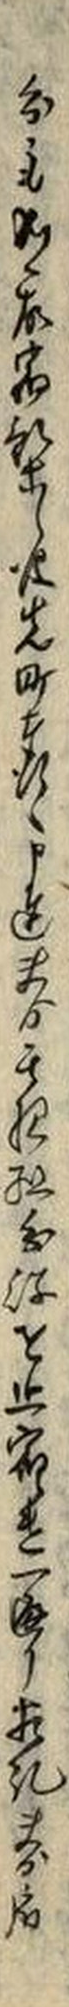分ニも成候故宿願等之儀先町奉行へ申達夫ゟ其夜組分役を止宿へ遣一通り相糺夫ゟ府
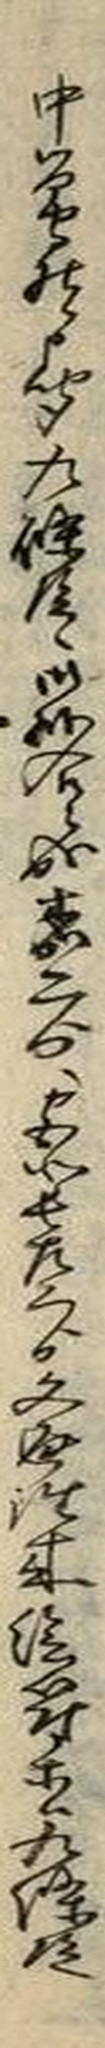中留守居へ申聞九條殿へ御掛合ニ成森二右衛門へ宮北長左衛門ゟ文通往来絵符等ハ九條殿
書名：御国他国諸事之部
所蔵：福井県文書館 Fukui Prefectural Archives
